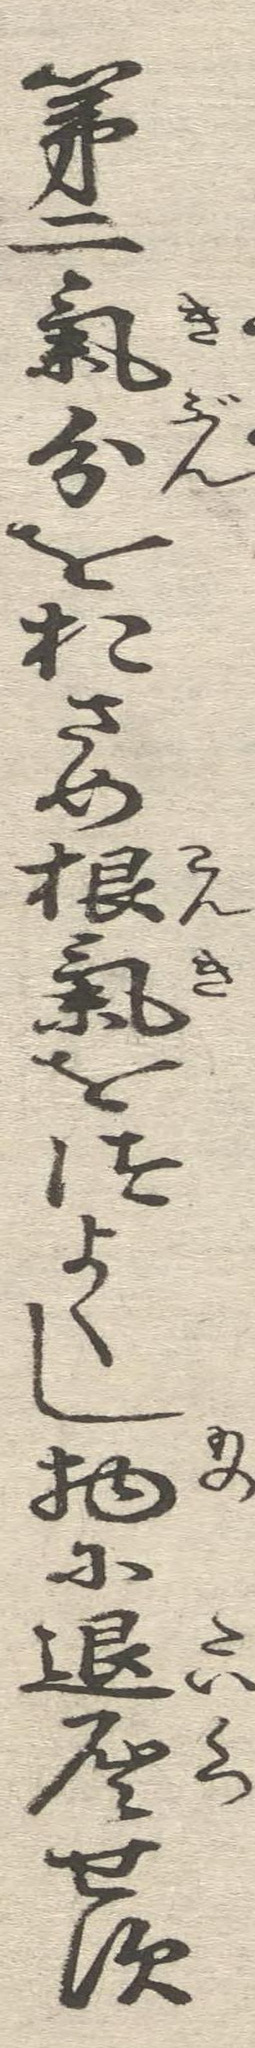第二気分をおさめ根気をつよくし物に退屈せす
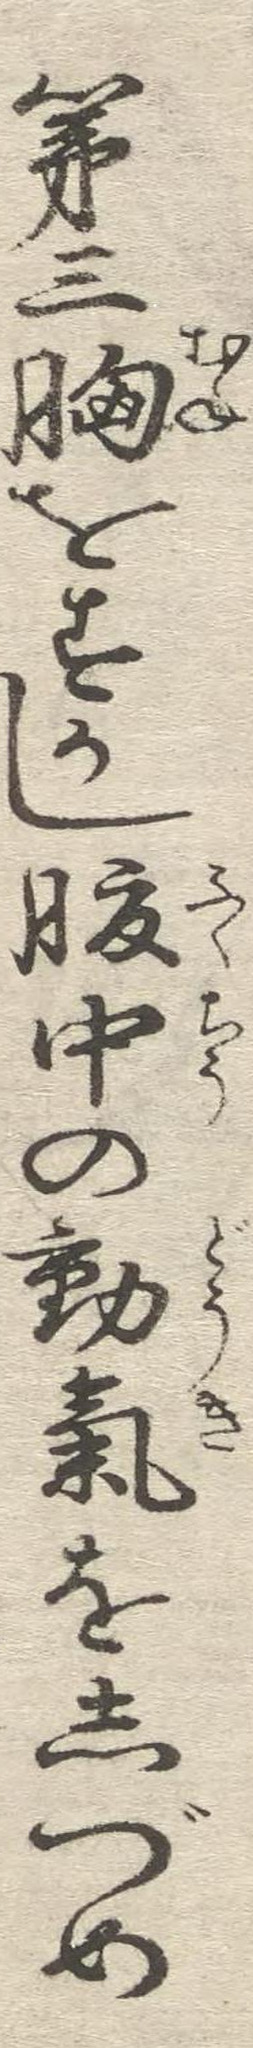第三胸をすかし腹中の動気をしづめ
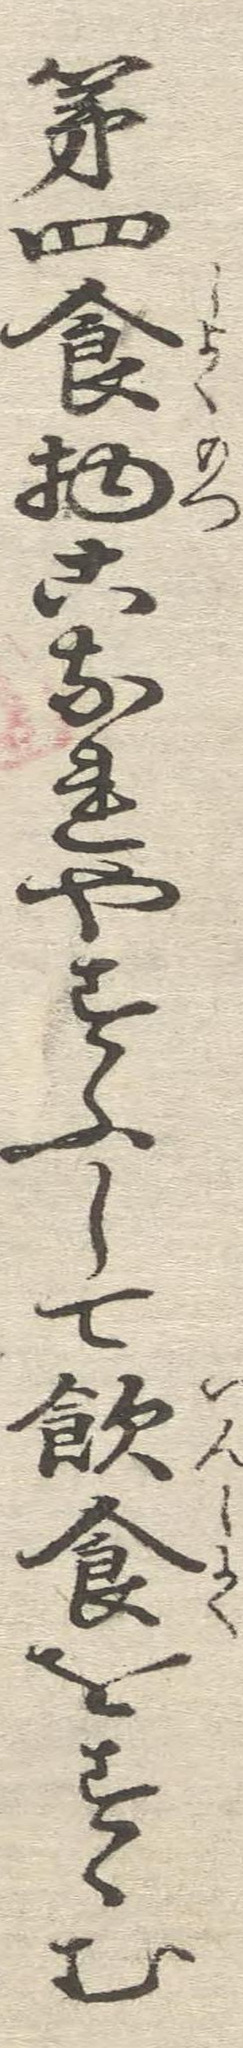第四食物こなれやすふして飲食をすゝむ
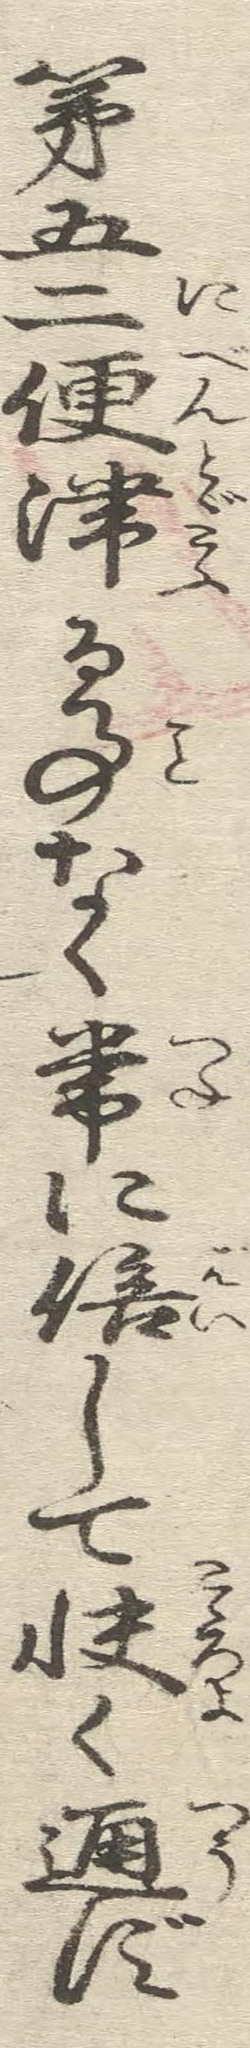第五二便滞る事なく常に倍して快く通ず
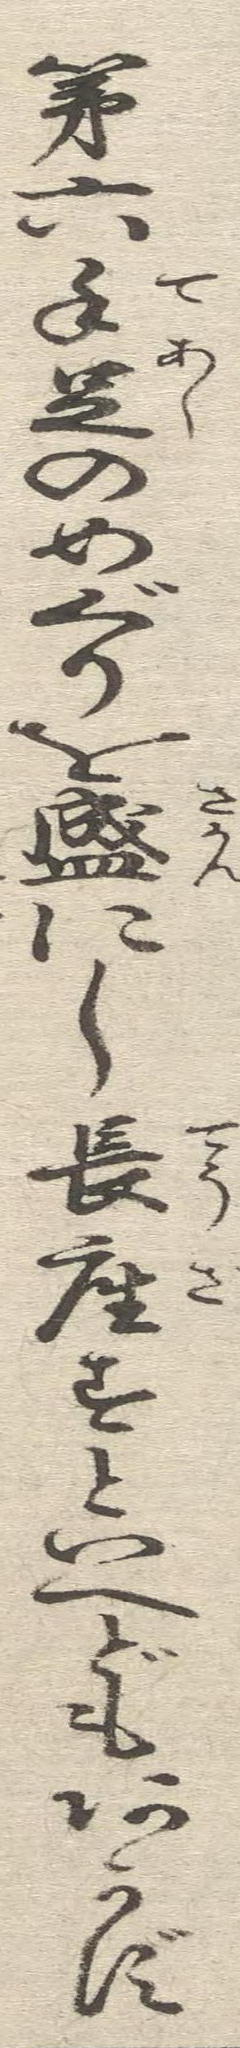第六手足のめぐりを盛にし長座すといへどもあかず
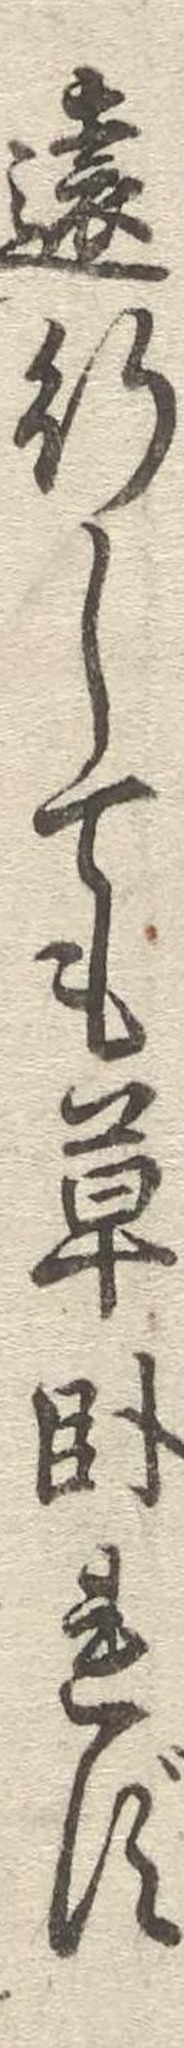遠行しても草臥れず
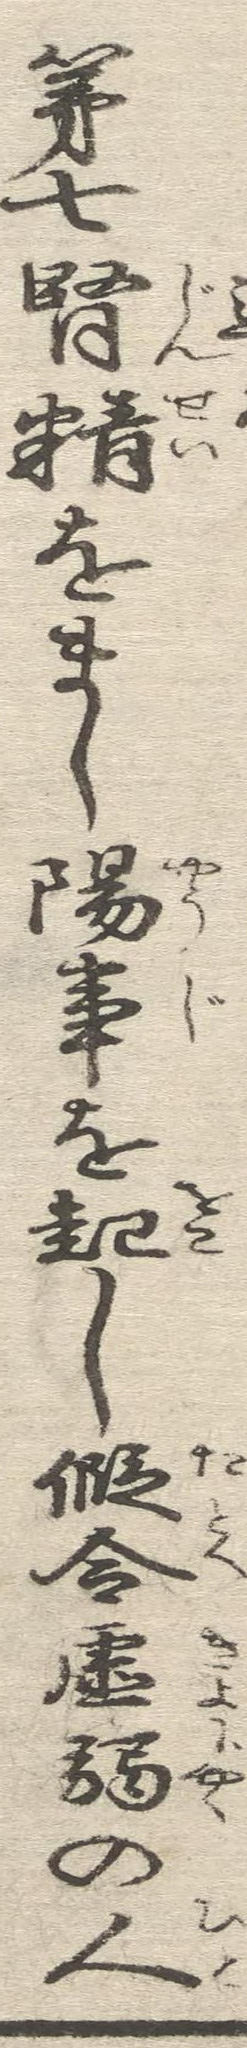第七腎精をまし陽事を起し仮令虚弱の人
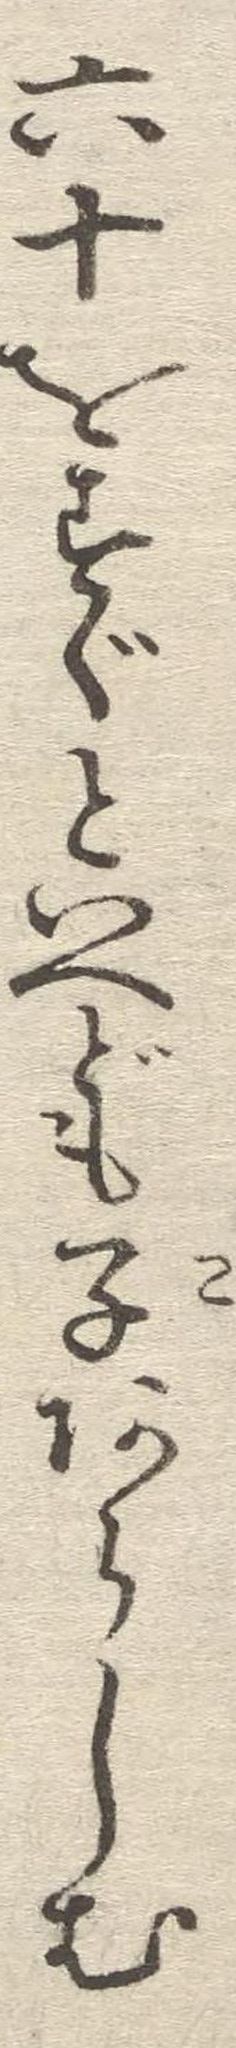六十をすぐといへども子あらしむ
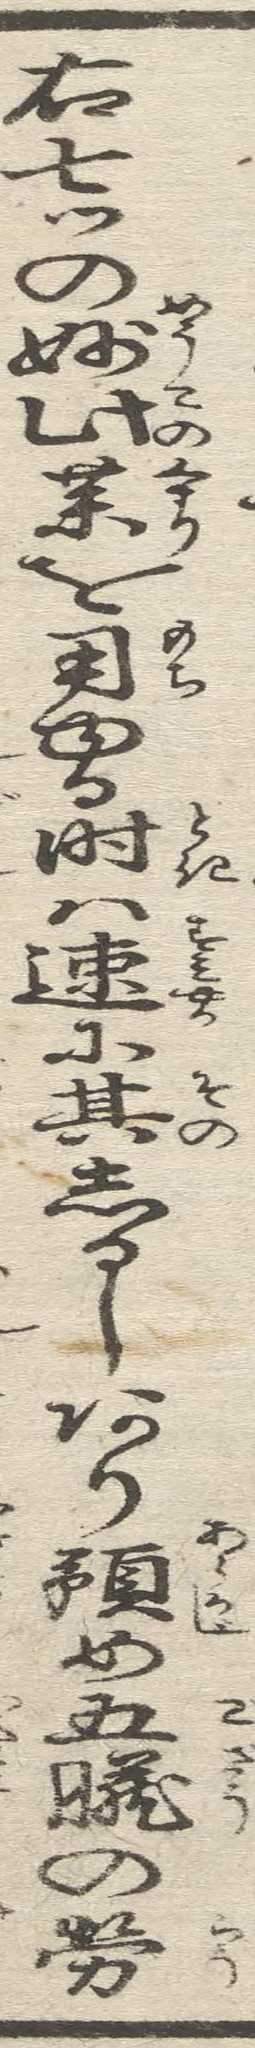右七つの妙此薬を用ゆる時は速に其しるしあり預め五臓の労
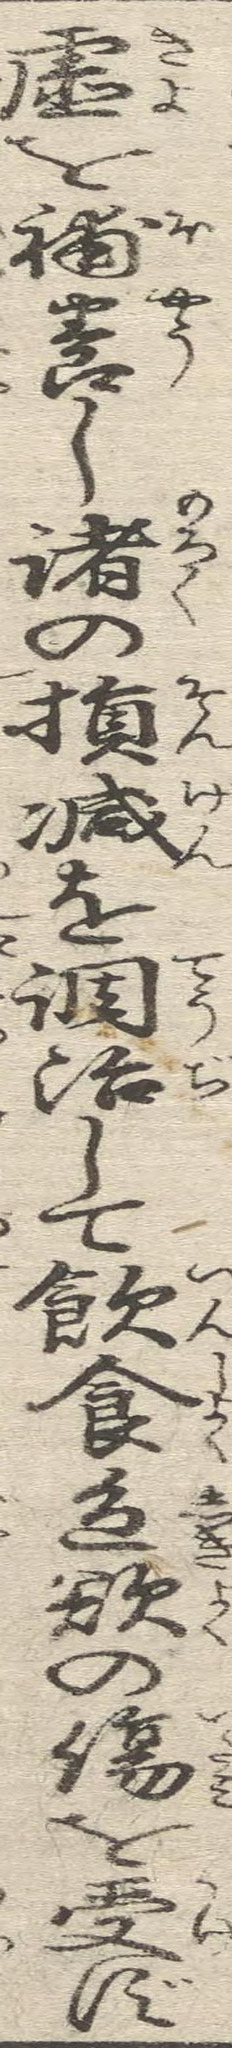虚を補養し諸の損減を調治して飲食色欲の傷を受ず
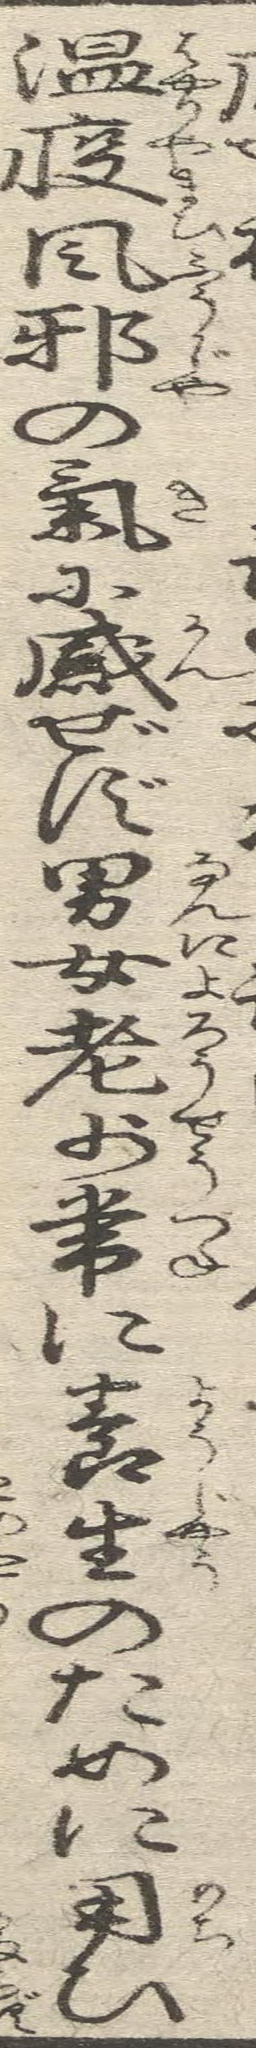温疫風邪の気に感ぜず男女老少常に養生のために用ひ
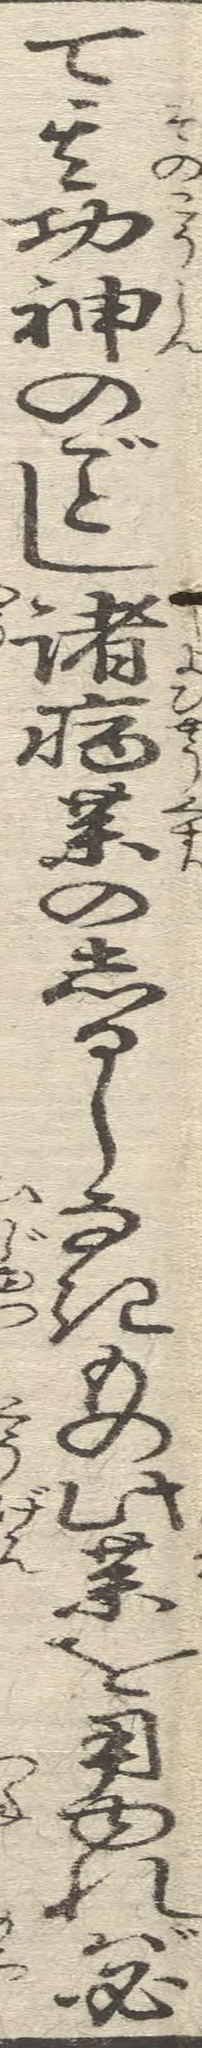て其功神のごとし諸病薬のしるしなきもの此薬を用ゆれば必
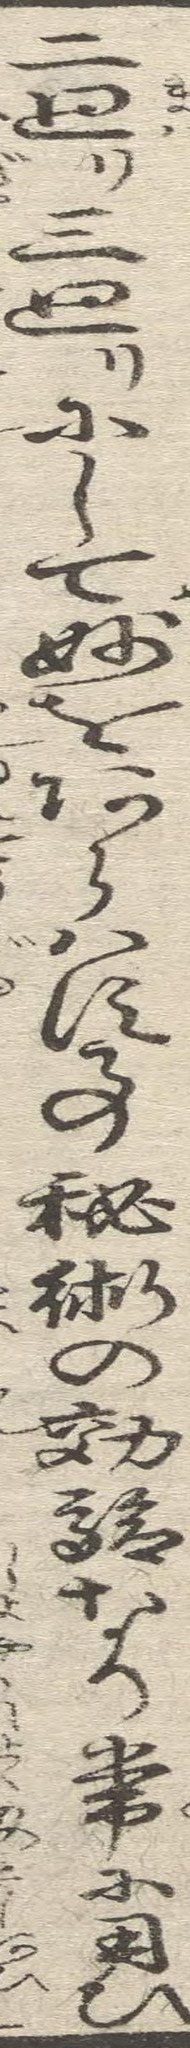二廻三廻妙をあらはす事秘術の効験なり常に用ひ
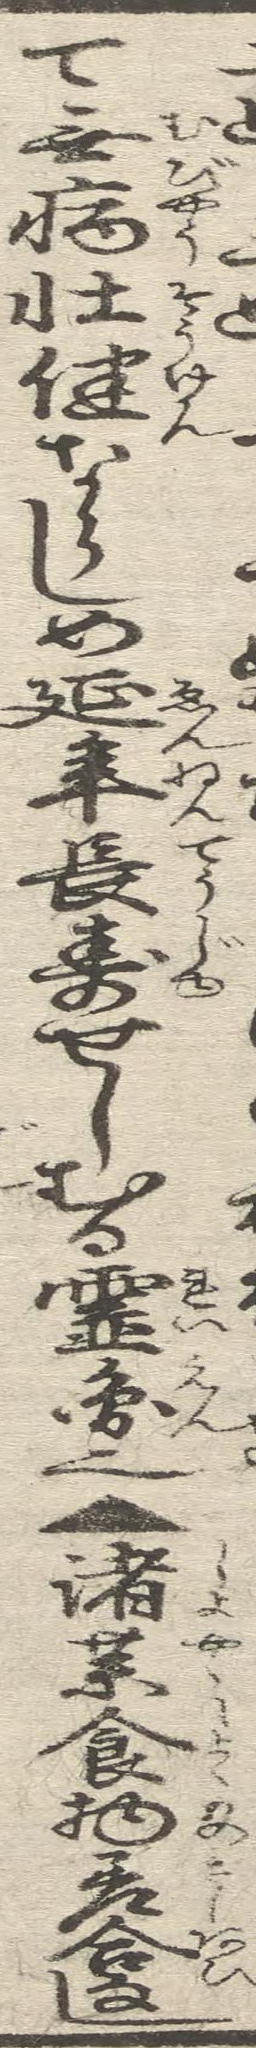て無病壮健ならしめ延年長寿せしむる霊円也▲諸薬食物差合なし
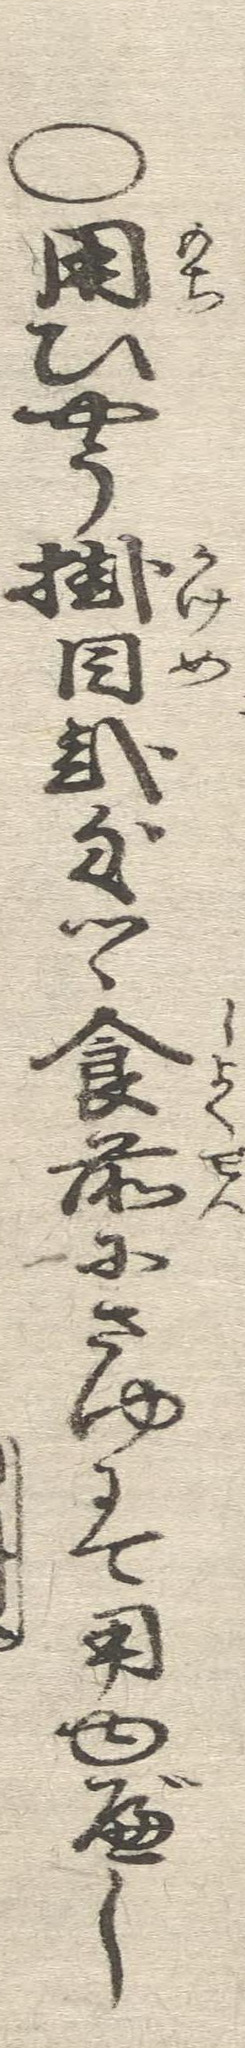○用ひやう掛目弐匁ッヽ食前にさゆにて用ゆべし
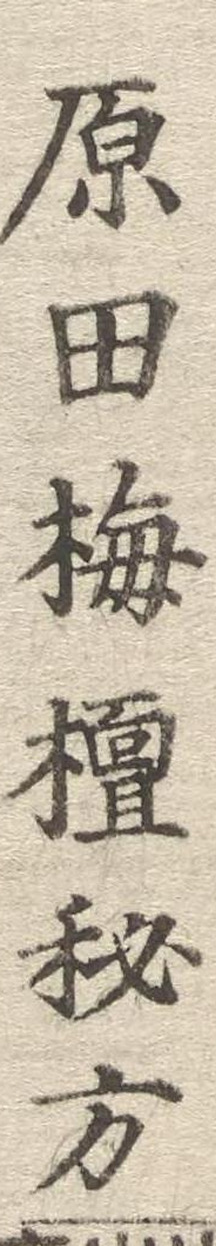原田梅檀秘方
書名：浪華薬種問屋能書張交帖. 一
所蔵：国立国会図書館 National Diet Library, JAPAN
